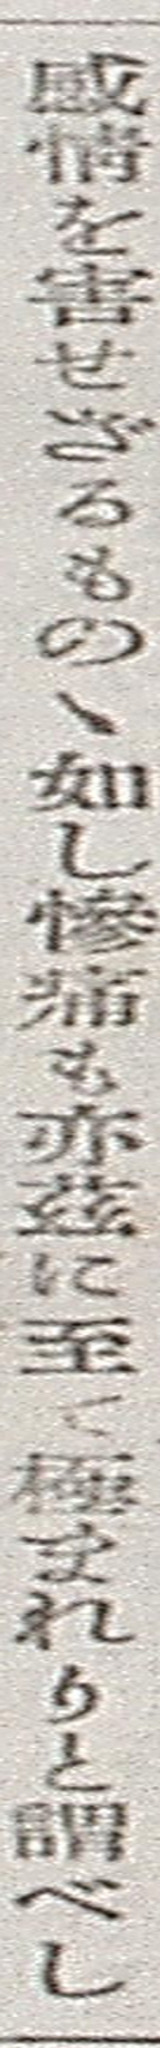感情を害せざるものゝ如し惨痛も亦茲に至て極まれりと謂べし
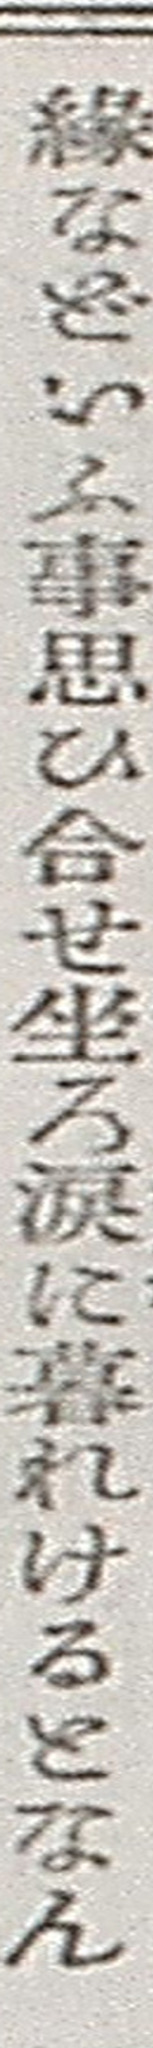縁などいふ事思ひ合せ坐ろ涙に暮れけるとなん
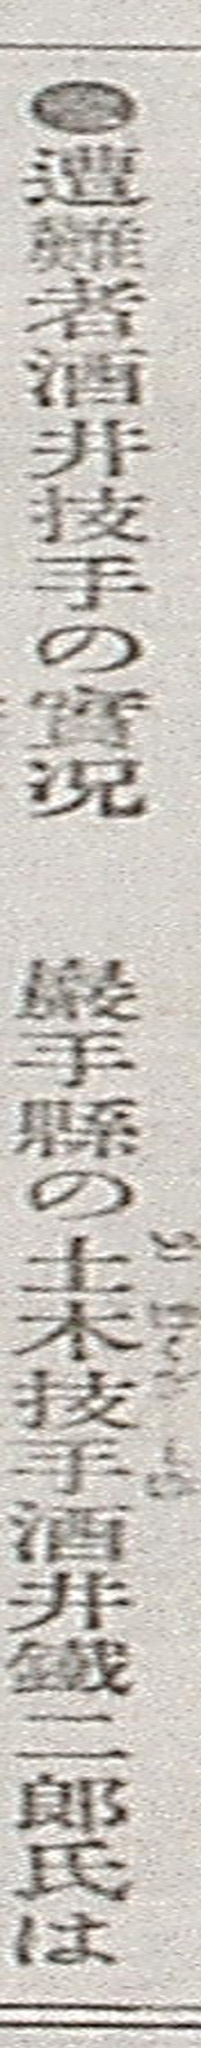●遭難者酒井技手の実況巌手県の土木技手酒井鐵二郎氏は
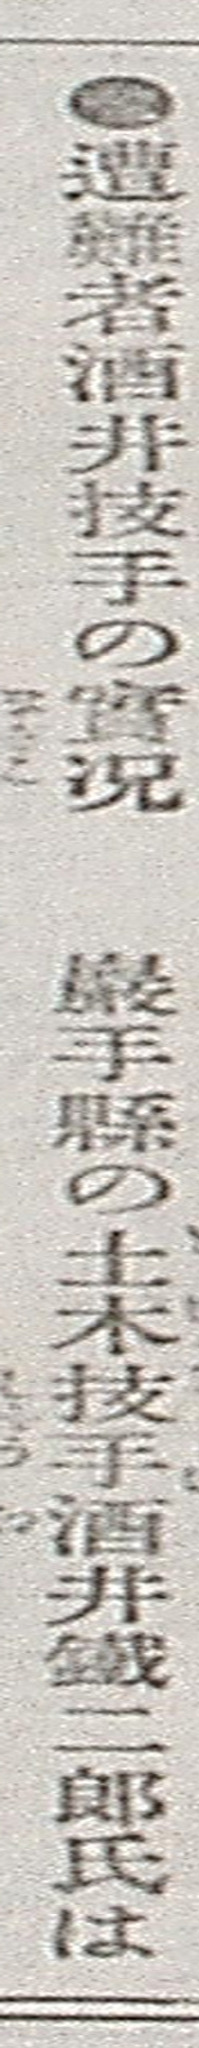●遭難者酒井技手の実況巌手県の土木技手酒井鐵二郎氏は
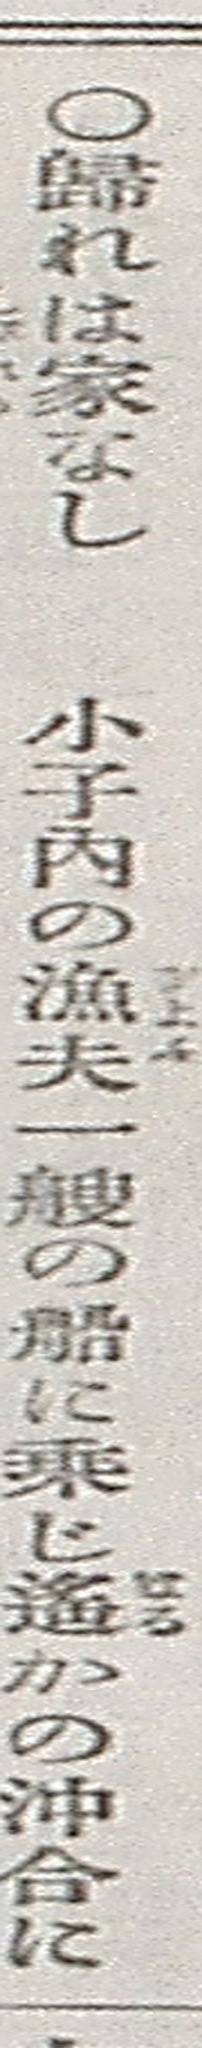○帰れば家なし小子内の漁夫一艘の船に乗じ遙かの沖合に
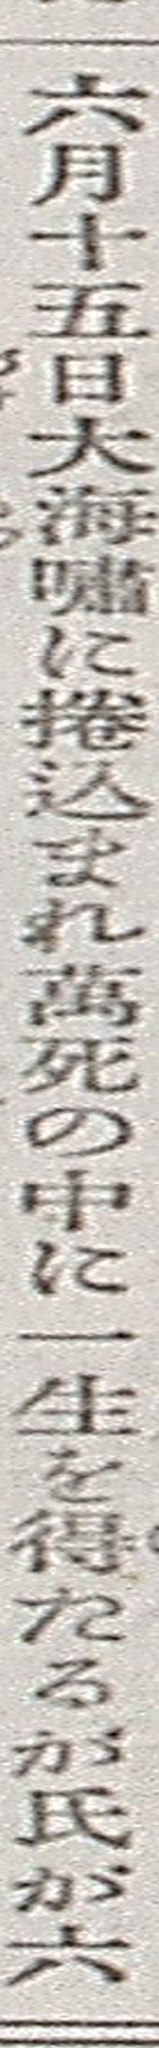六月十五日大海嘯に捲込まれ万死の中に一生を得たるが氏が六
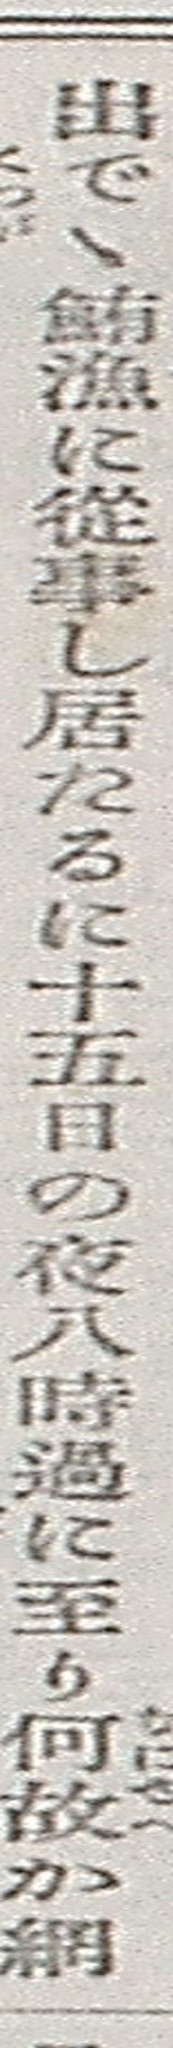出でゝ鮪漁に従事し居たるに十五日の夜八時過に至り何故か網
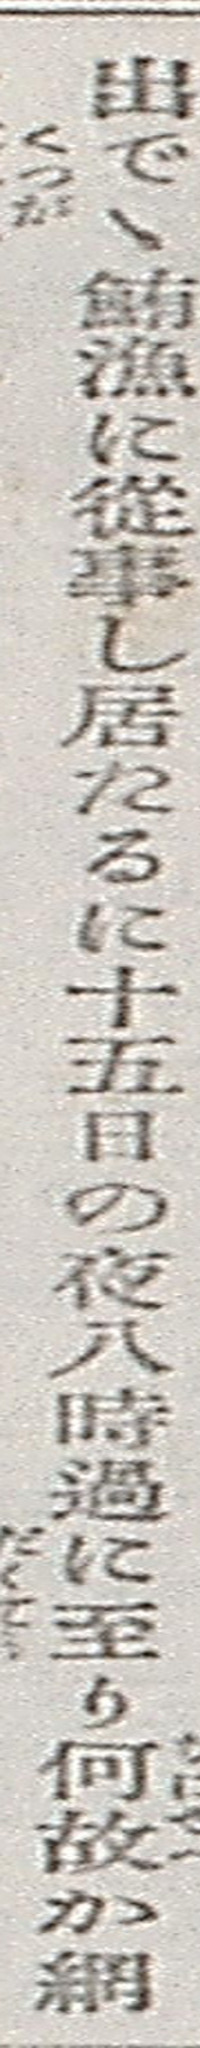出でゝ鮪漁に従事し居たるに十五日の夜八時過に至り何故か網
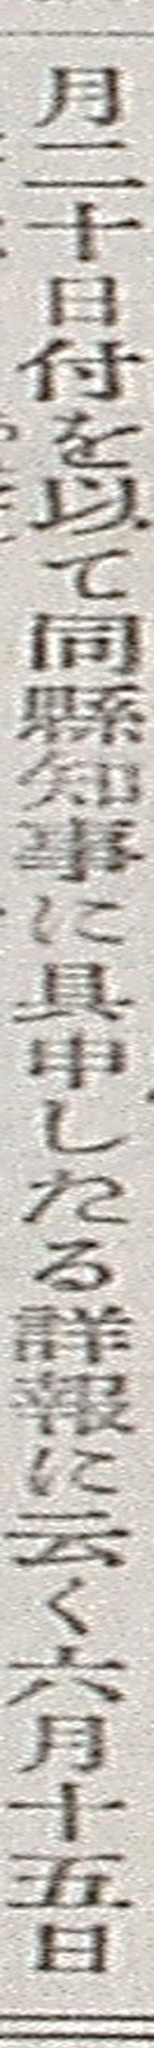月二十日付を以て同県知事に具申したる詳報に云く六月十五日
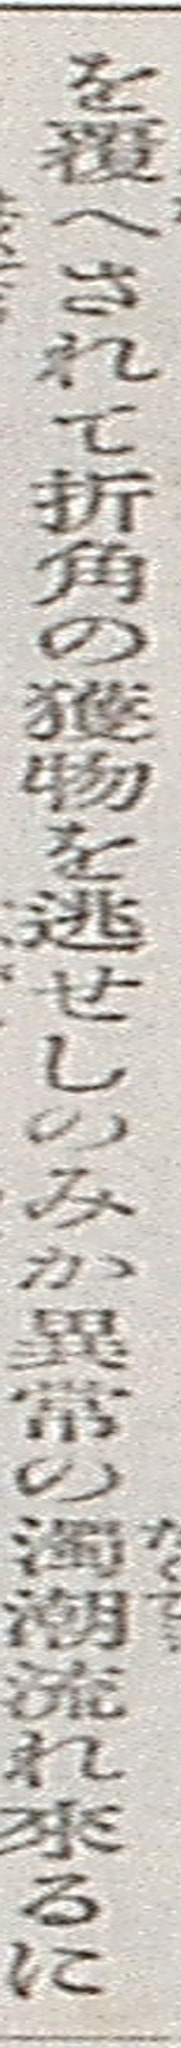を覆へされて折角の獲物を逃せしのみか異常の濁潮流れ来るに
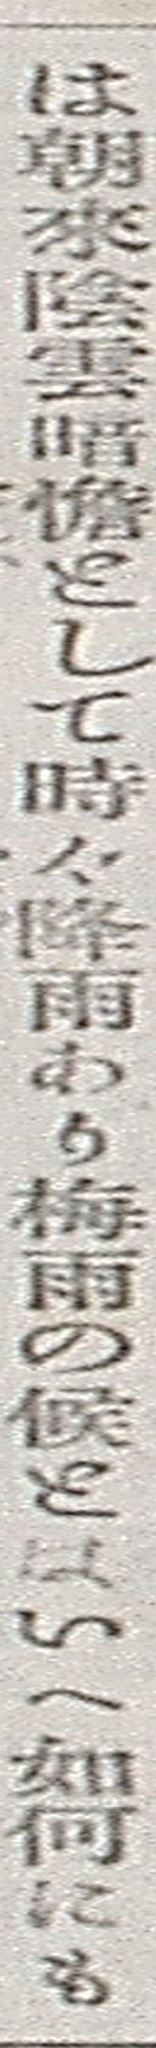は朝来陰雲暗憺として時々降雨あり梅雨の候とはいへ如何にも
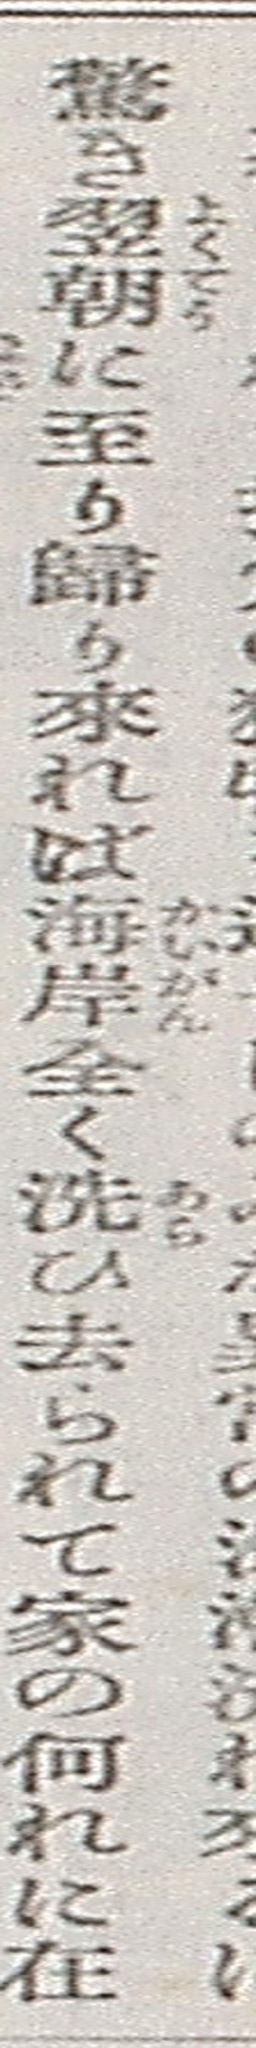驚き翌朝に至り帰り来れば海岸全く洗ひ去られて家の何れに在
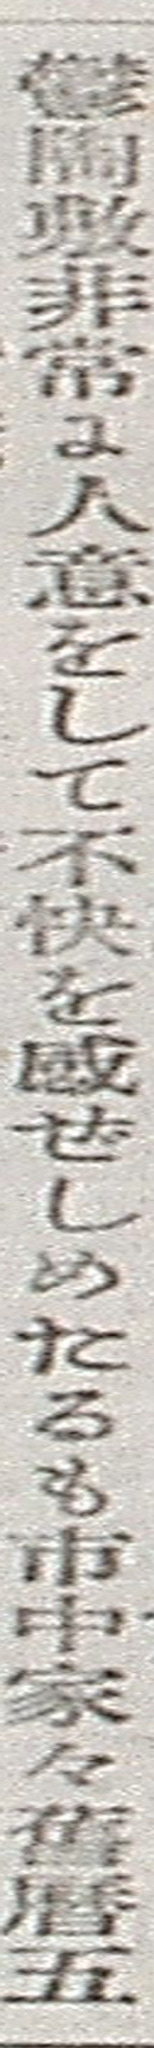鬱陶敷非常に人意をして不快を感ぜしめたるも市中家々旧暦五
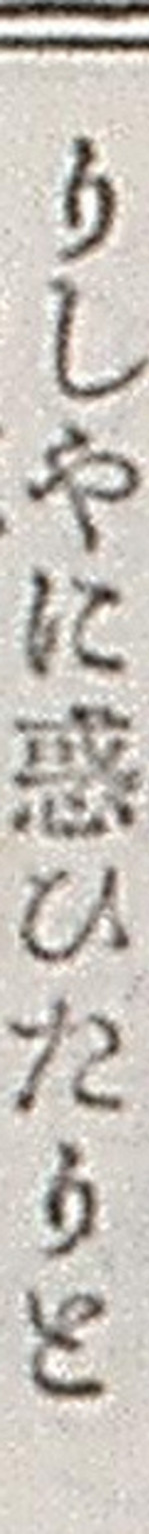りしやに惑ひたりと
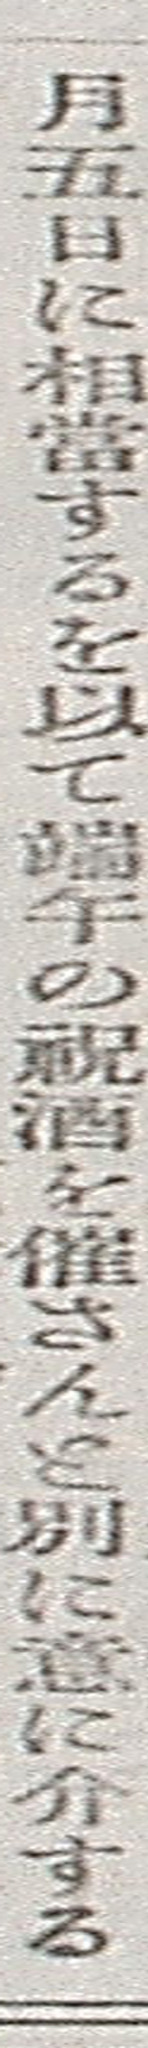月五日に相当するを以て端午の祝酒を催さんと別に意に介する
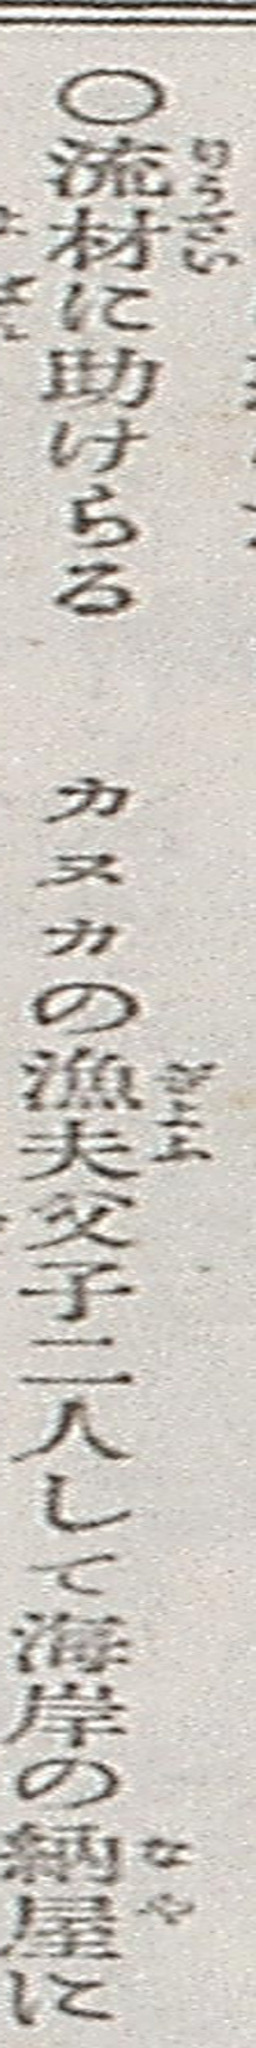○流材に助けらるカヌカの漁夫父子二人して海岸の納屋に
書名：風俗畫報臨時増刊第百二十號　大海嘯被害録（下）
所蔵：東京大学地震研究所図書室 Earthquake Research Institute Library, The University of Tokyo, JAPAN
